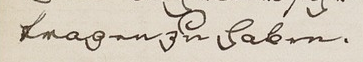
tragen zu haben.
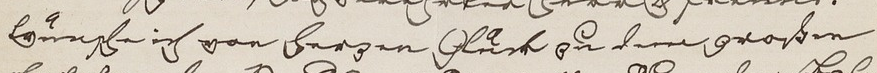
wünsche ich von Herzen Glück zu dem großen
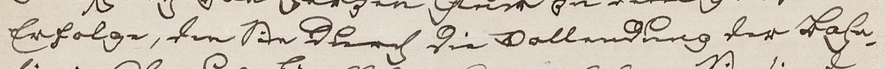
Erfolge, den Sie durch die Vollendung der Bahn-
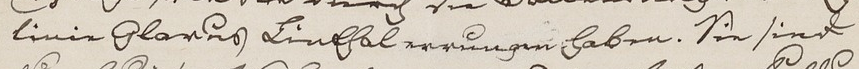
linie GlarusLinthal errungen haben. Sie sind
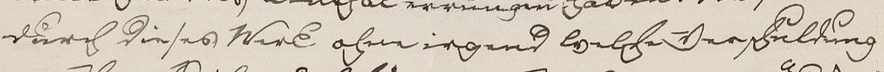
durch dieses Werk ohne irgend welche Verschuldung
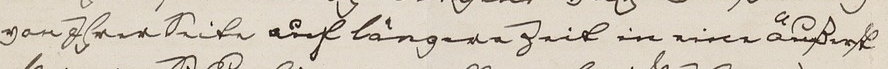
von Ihrer Seite auf längere Zeit in eine äußerst
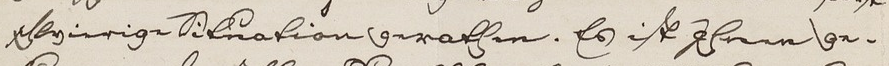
schwierige Situation gerathen. Es ist Ihnen ge-
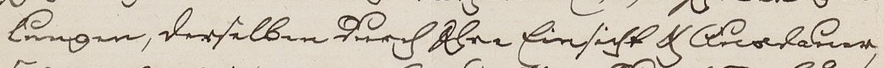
lungen, derselben durch Ihre Einsicht & Ausdauer
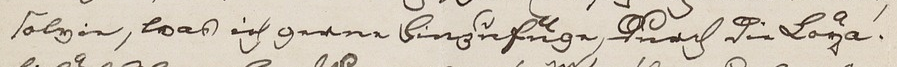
sowie, was ich gerne hinzufüge, durch die Loya-
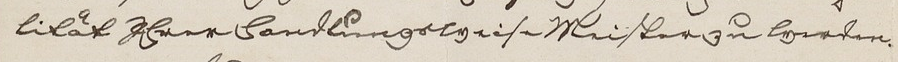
lität Ihrer Handlungsweise Meister zu werden.
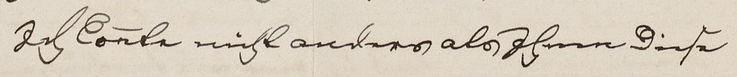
Ich konnte nicht anders als Ihnen diese
